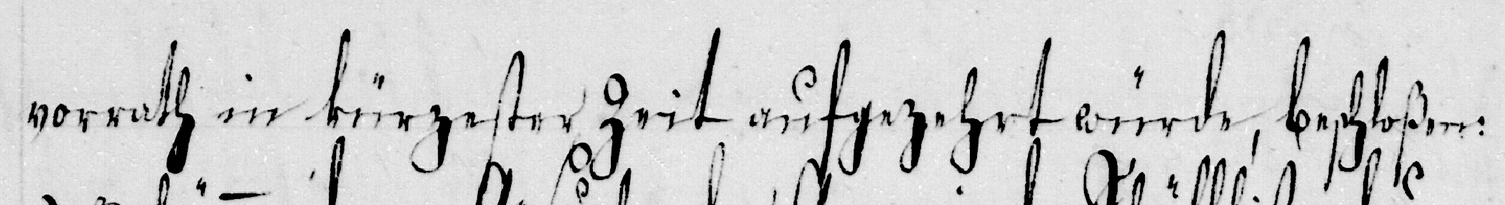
vorrath in kürzester Zeit aufgezehrt würde, beschloßen:
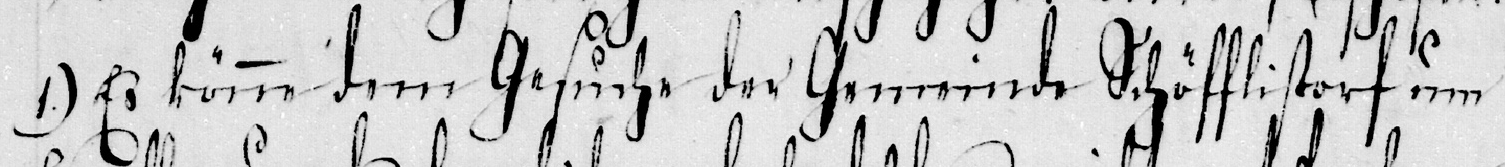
1.) Es könne dem Gesuche der Gemeinde Schöfflistorf um
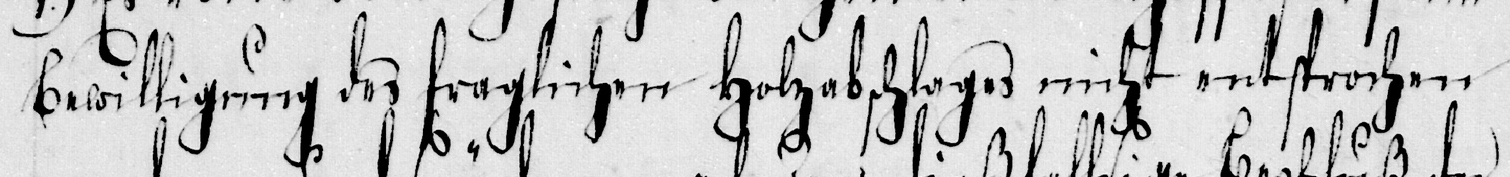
willigung des fraglichen Holzabschlages nicht entsprochen
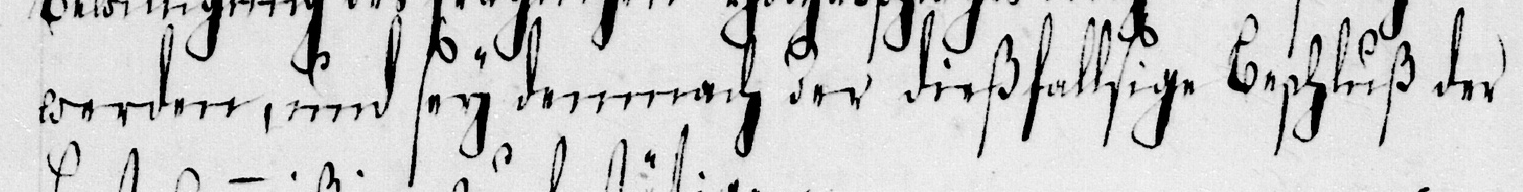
werden, und sey demnach der dießfällige Beschluß der
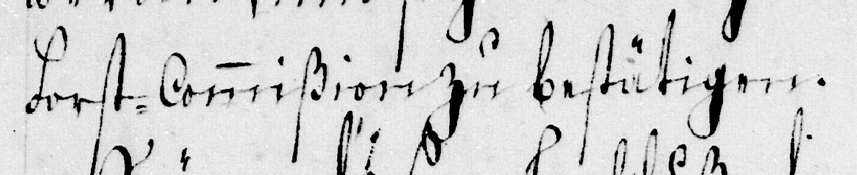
Forst-Commißion zu bestätigen.
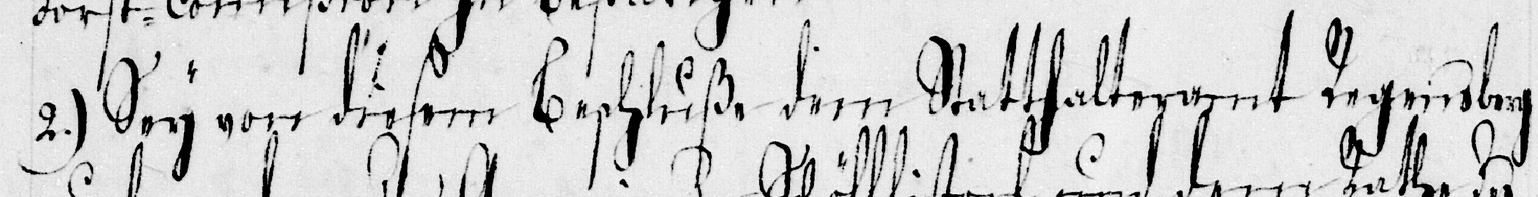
2.) Sey von diesem Beschluße dem Statthalteramt Regensbe¬
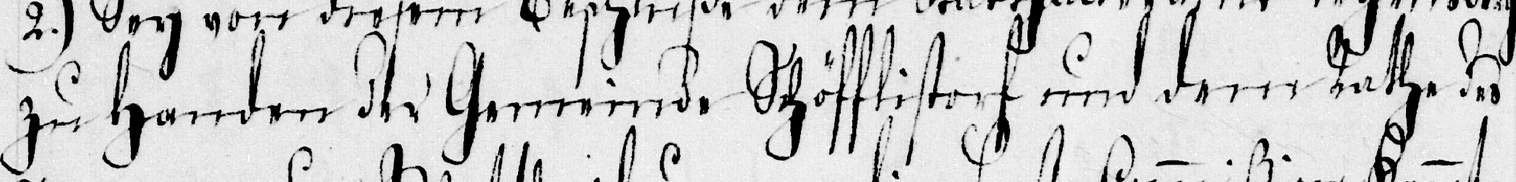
zu Handen der Gemeinde Schöfflistorf und dem Rathe des
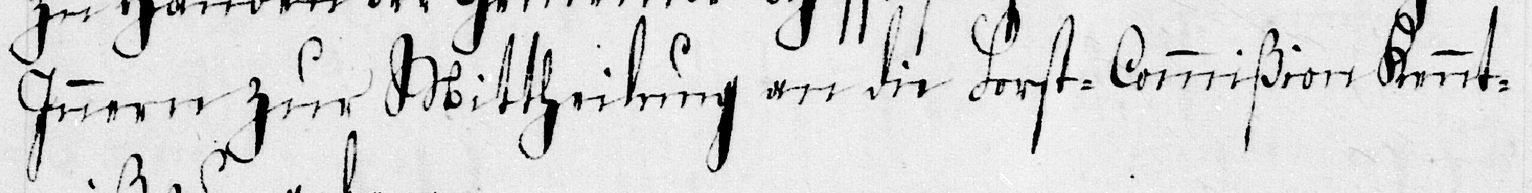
Innern zur Mittheilung an die Forst-Commißion Kennt¬
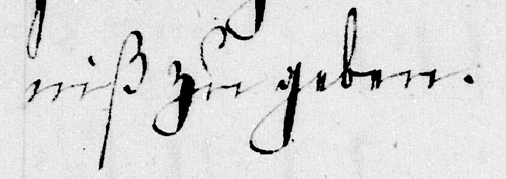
niß zu geben.
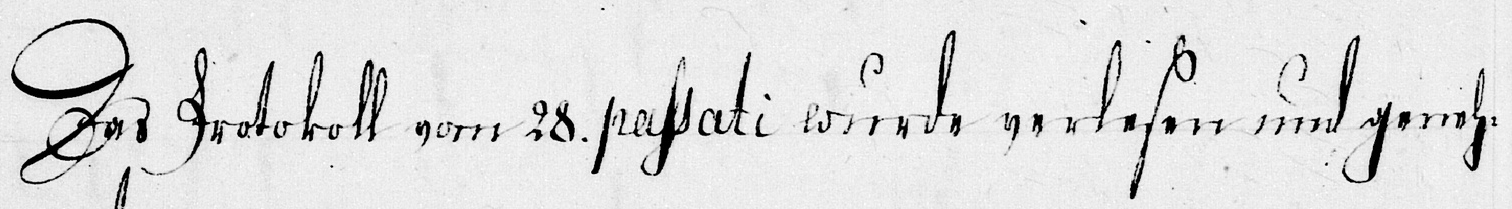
Das Protokoll vom 28. passati wurde verlesen und geneh¬
